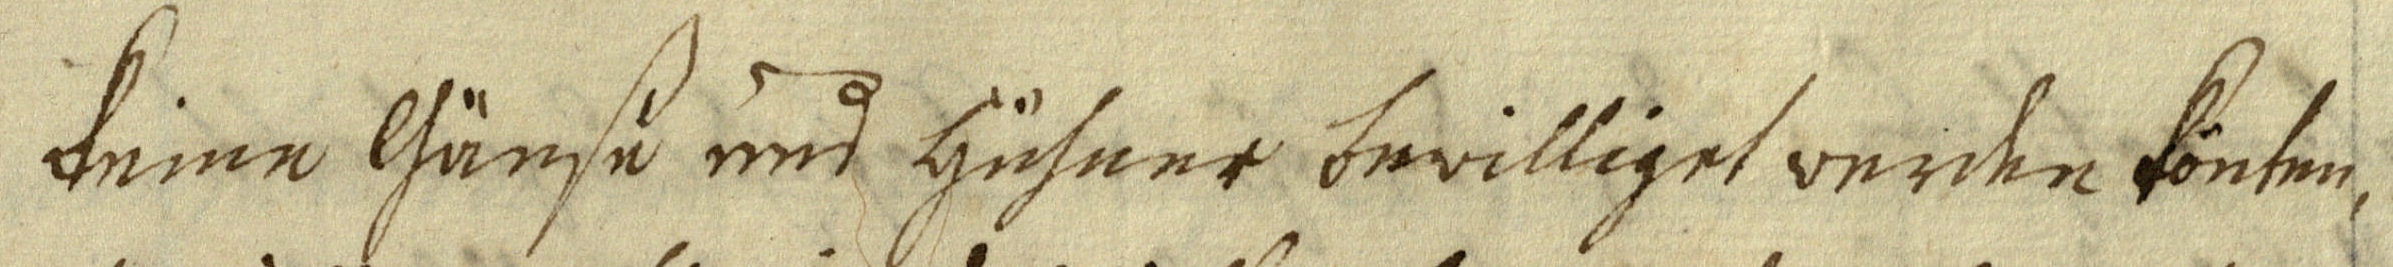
keine Gänse und Hühner bewilliget werden könten,
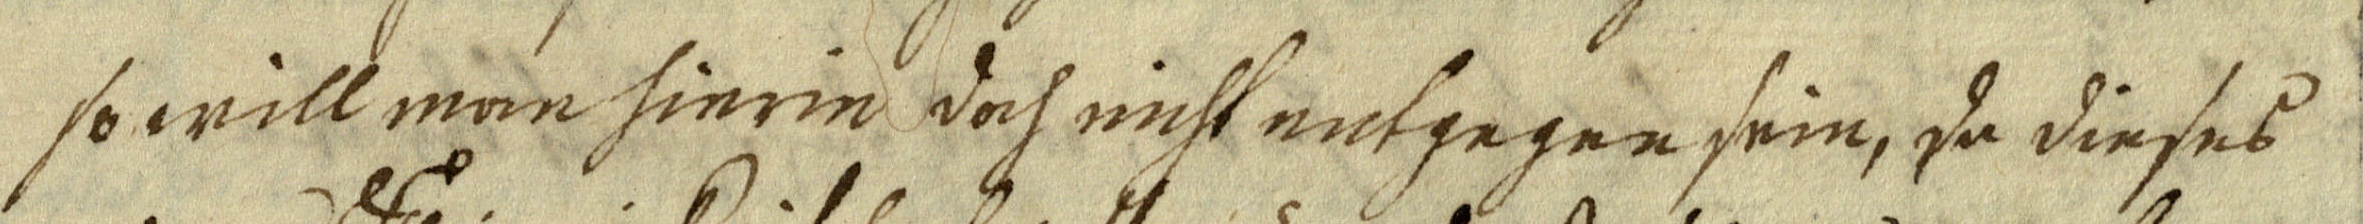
so will man hierin doch nicht entgegen sein, da dieses
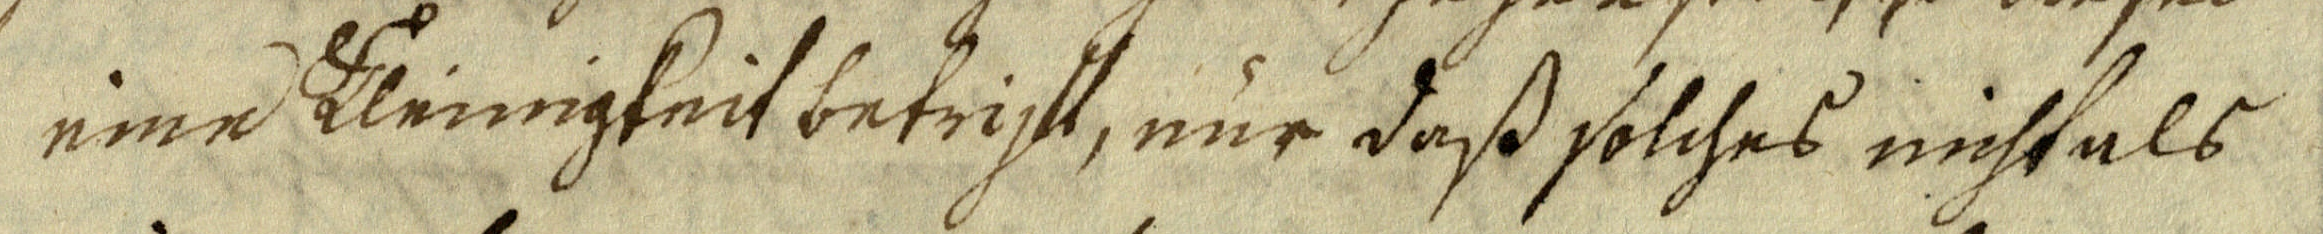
eine Kleinigkeit betrift, nur daß solches nicht als
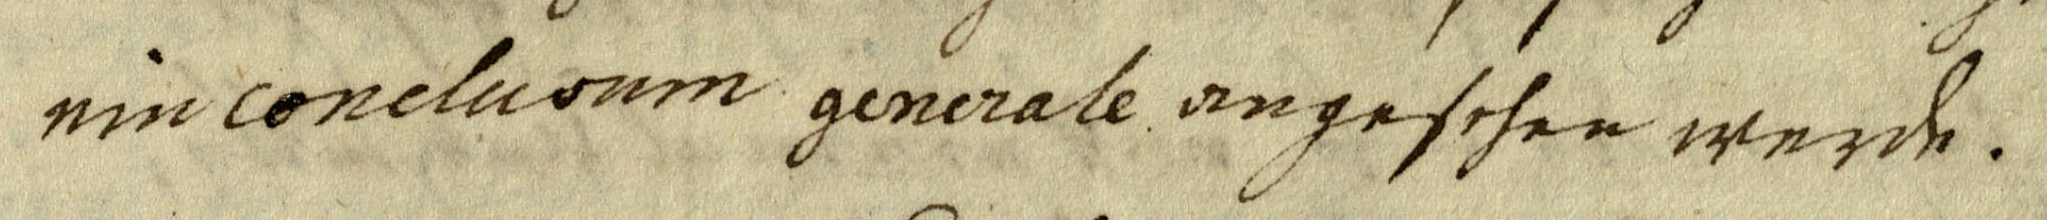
ein conclusum generale angesehen werde.
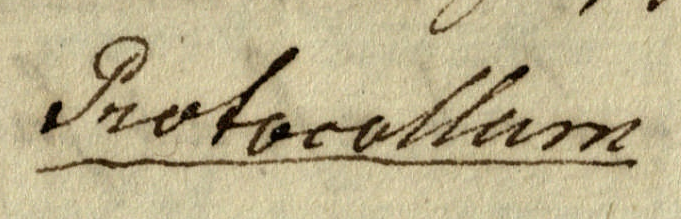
Protocollum
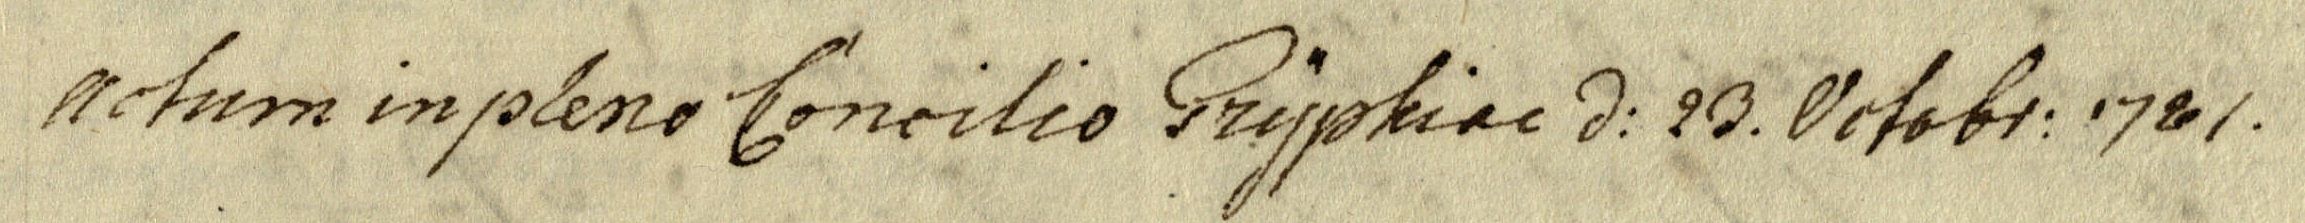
actum in pleno Concilio Grÿphiae d: 23. Octobr: 1781
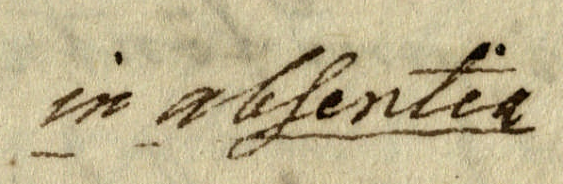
in absentia
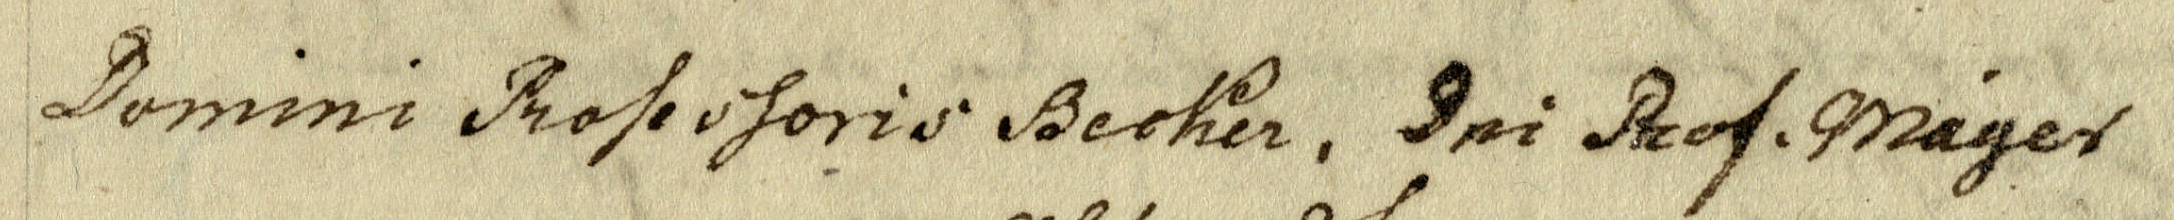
Domini Professoris Becker, dei Prof. Maÿer
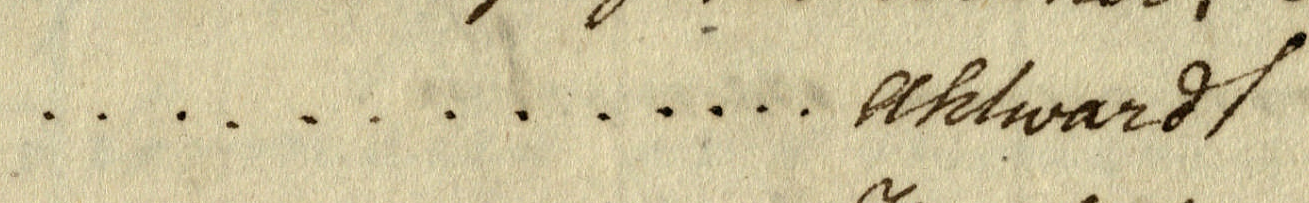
Ahlwardt
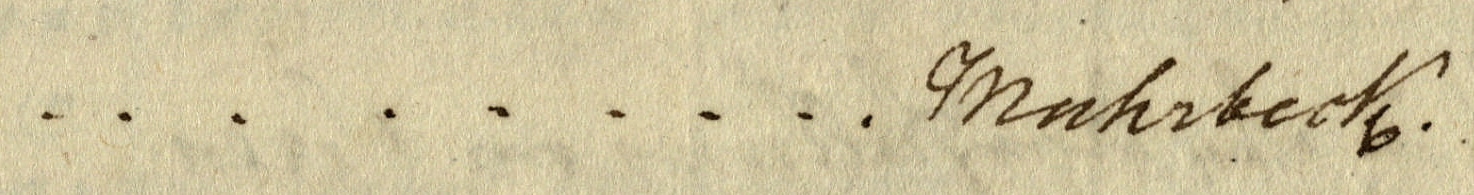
Muhrbeck
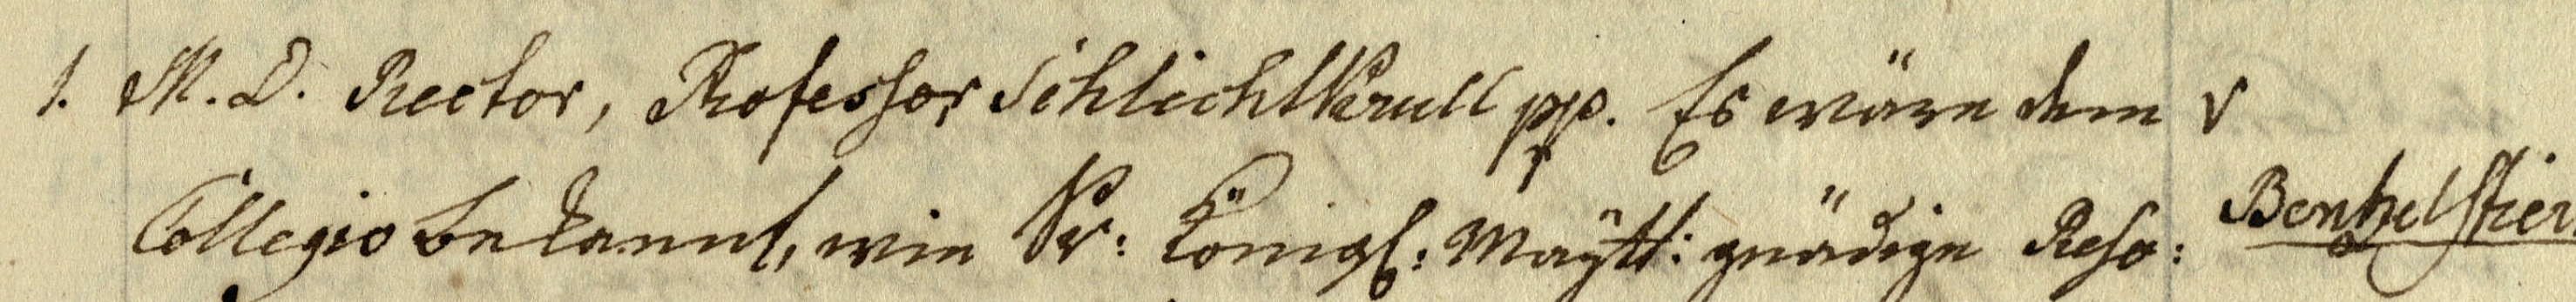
1. M. D. Rector, Professor Schlichtkrull pp. Es wäre dem
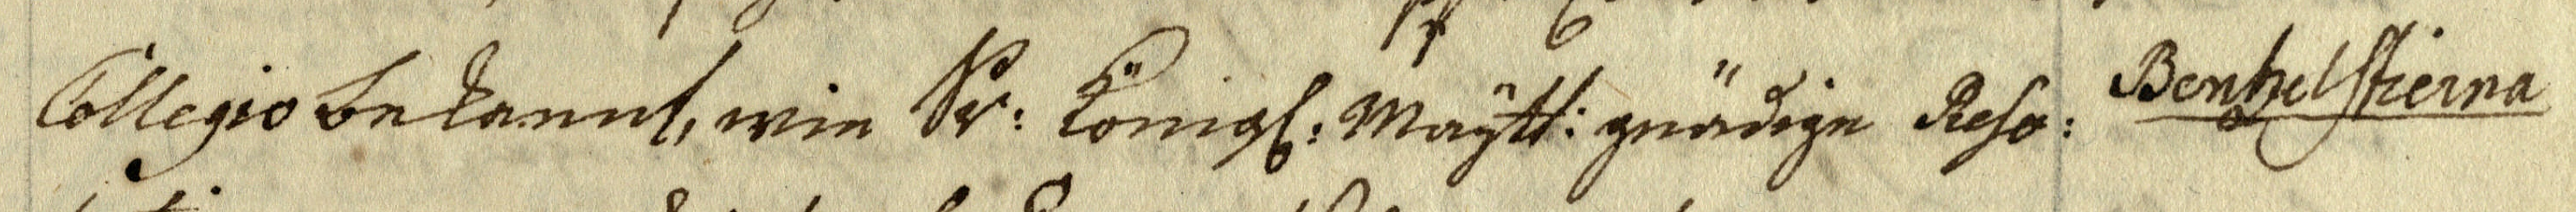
Collegio bekannt, wie Sr: Königl: Maÿst: gnädige Reso- Bentzelstierna
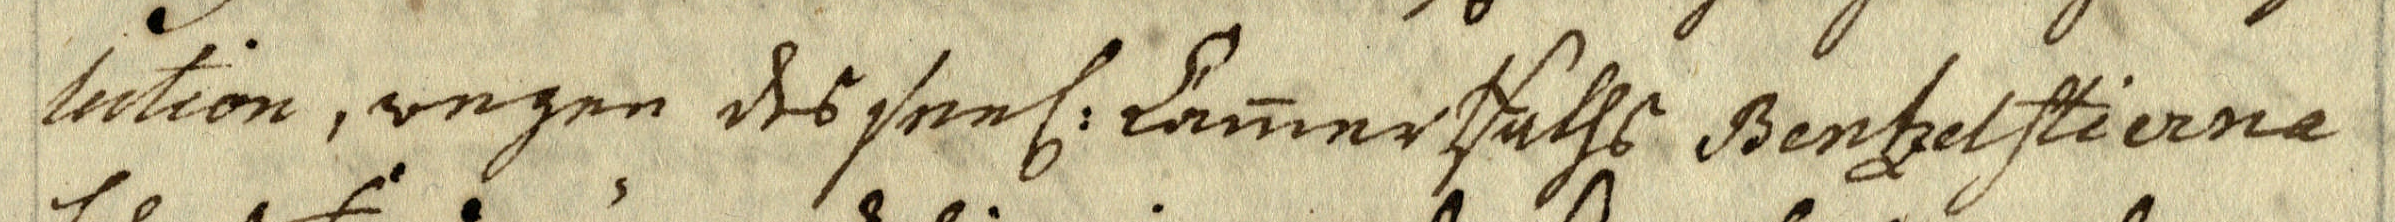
lution , wegen des seel: CamerRaths Bentzelstierna
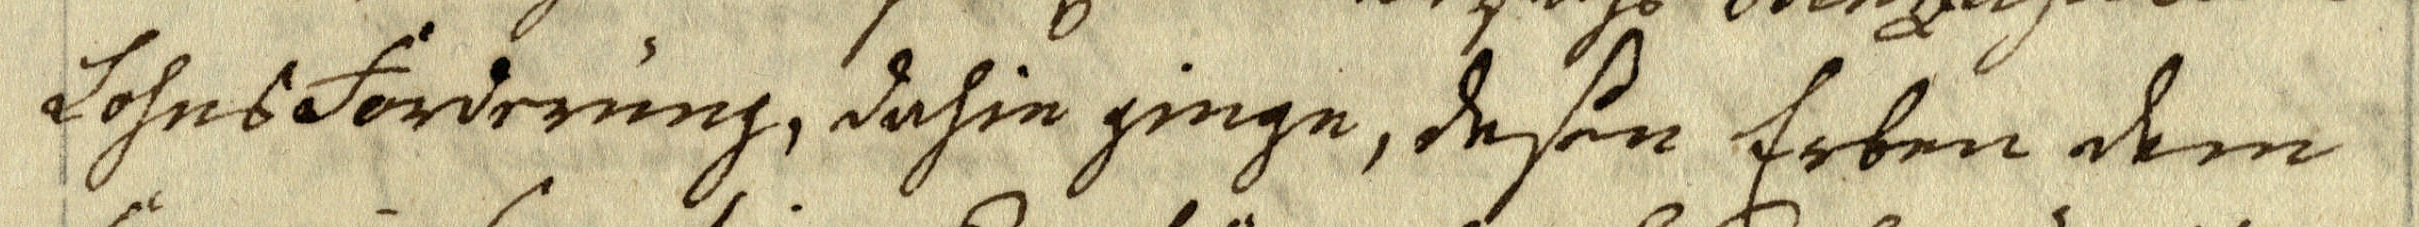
Lohnsforderung, dahin ginge, deßen Erben dem
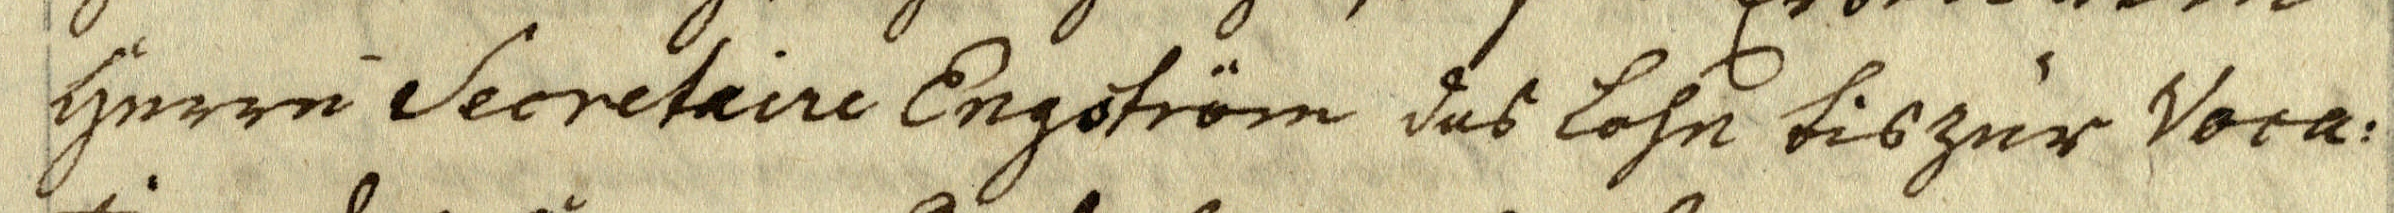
Herrn Secretaire Engström das Lohn bis zur Voca¬
